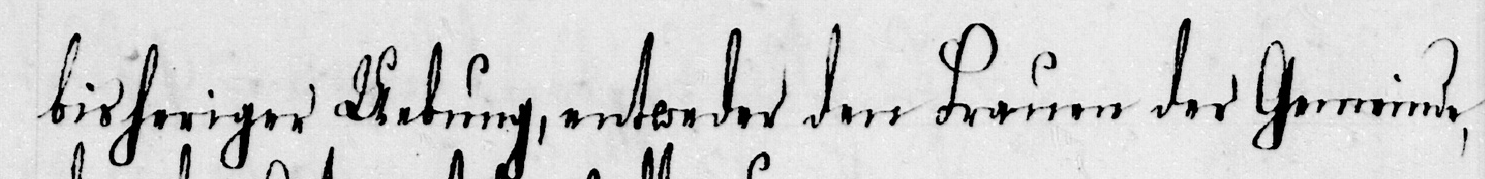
bisheriger Uebung, entweder der den Frauen der
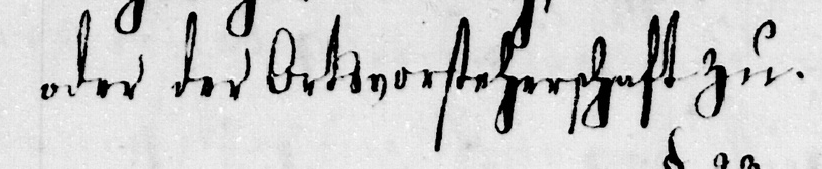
oder der Ortsvorsteherschaft zu.
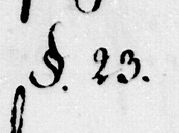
§. 23.
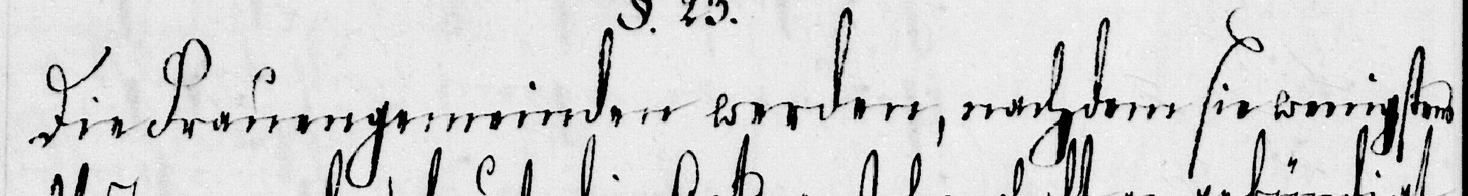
Die Frauengemeinden werden, nachdem sie wenigste¬
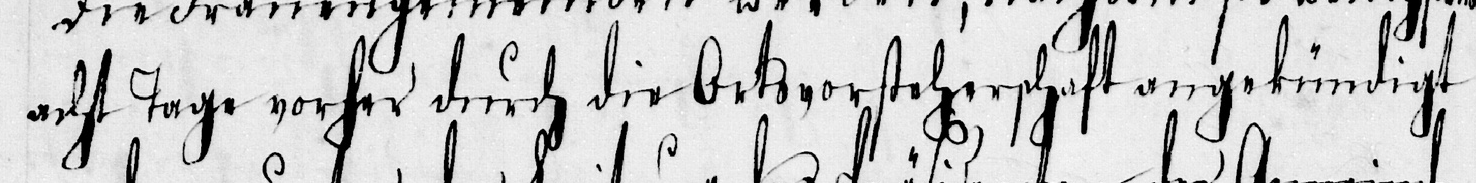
acht Tage vorher durch die Ortsvorsteherschaft angekündigt
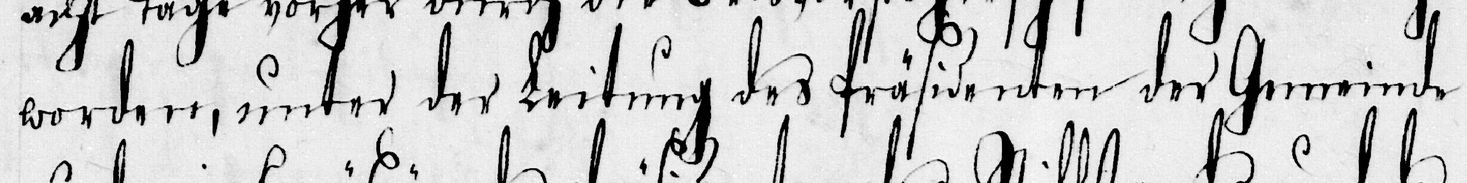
worden, unter der Leitung des Präsidenten der Gemeinde
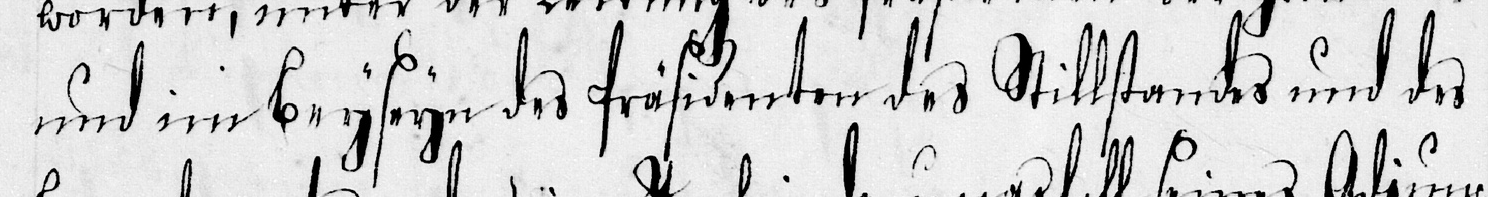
und im Beyseyn des Präsidenten des Stillstandes und des
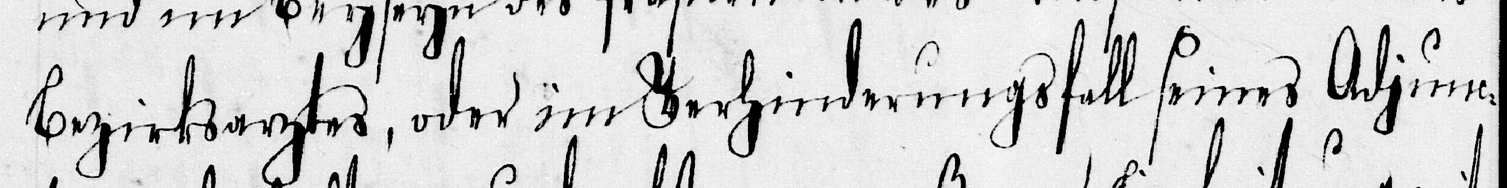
Bezirksarztes, oder im Verhinderungsfall seines Adjun¬
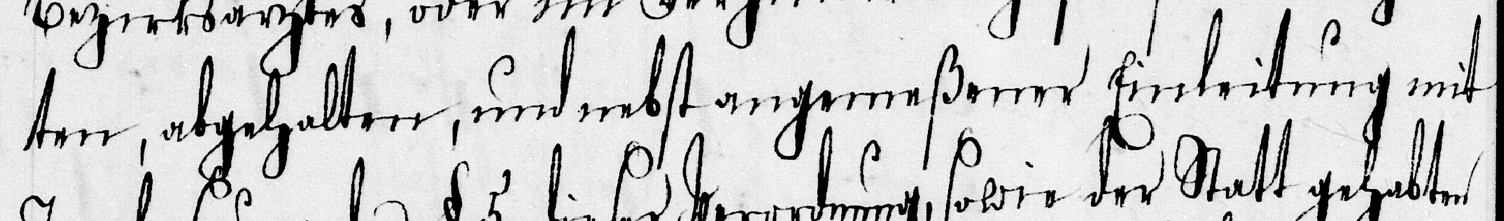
cten, abgehalten, und nebst angemeßener Einleitung mit
